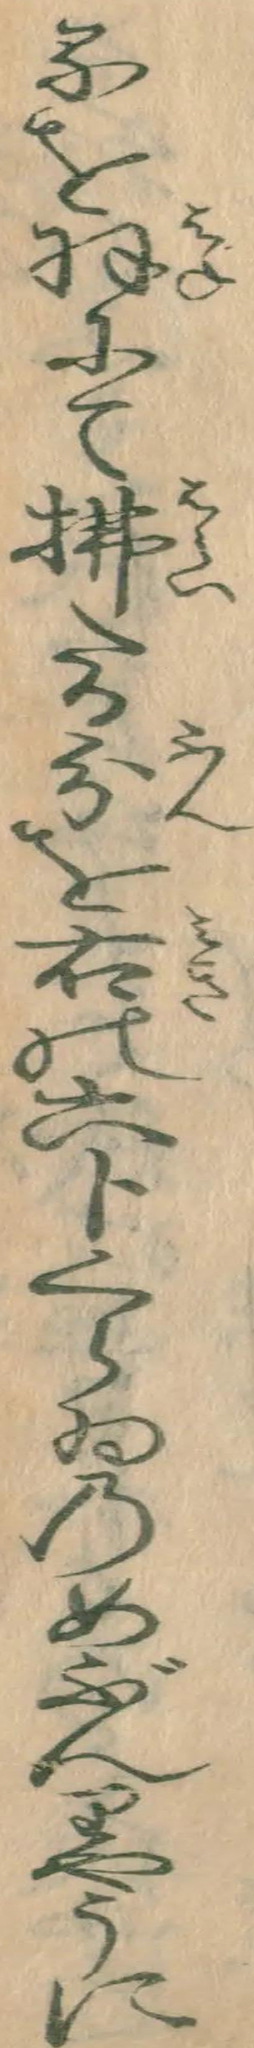るを羽にて払たる分を右の六分くらゐのめぶんりやうに

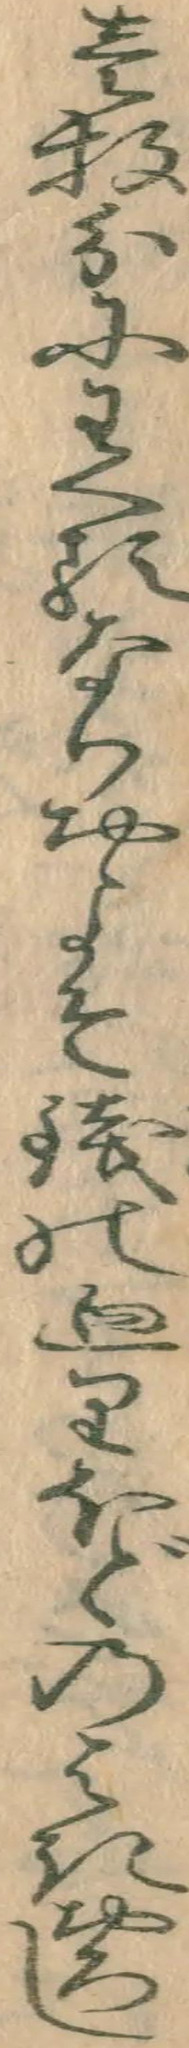壱枚分にわくるなりおよそ錢の廻りほどのはきおろし
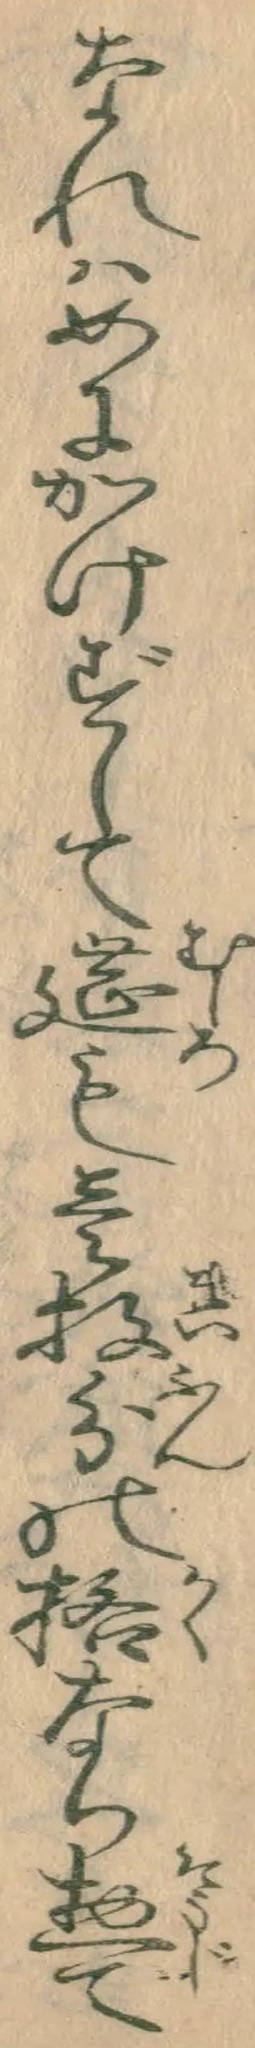なれはめにかけずして莚も壱枚分の格なり惣て
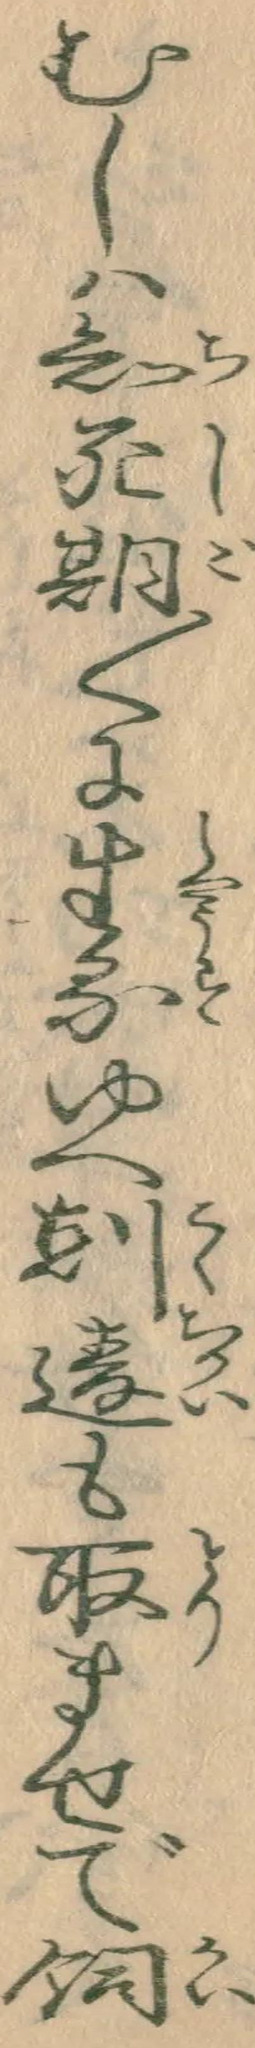むしは知死期〳〵に生るゆへ刻違も取ませで飼
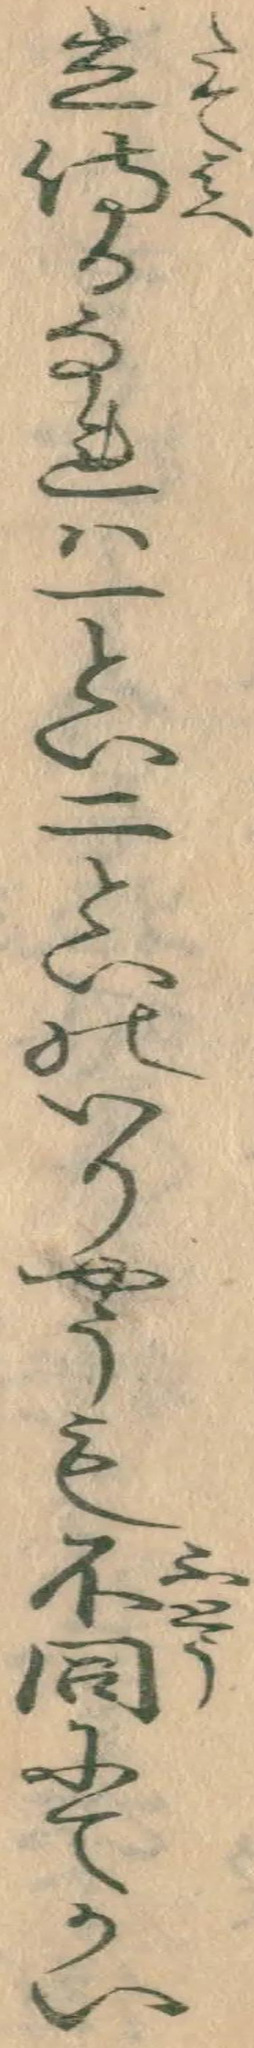立侍るなれは一とい二といのいりやうも不同にてかい
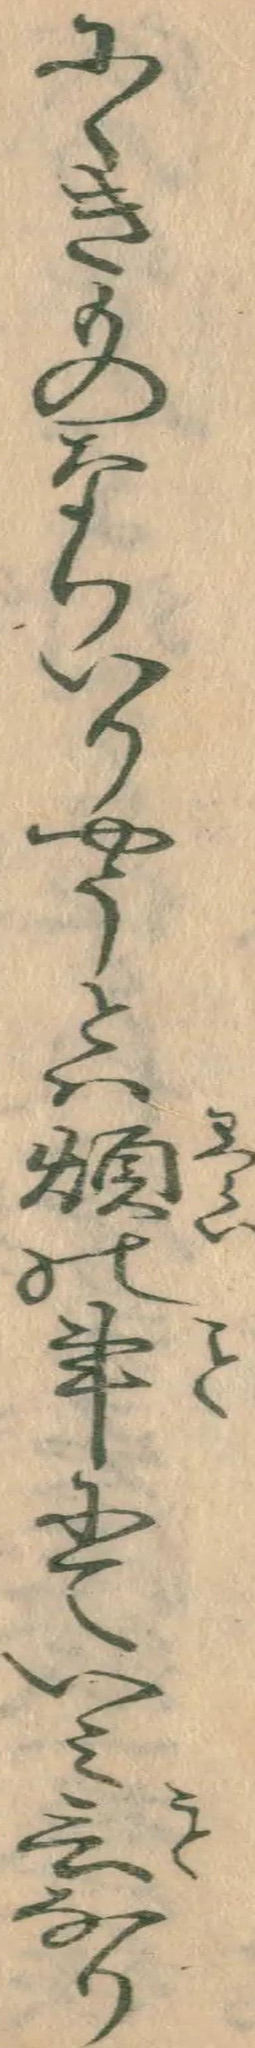にくきものなりいりやうとは煩の事にていみ言なり
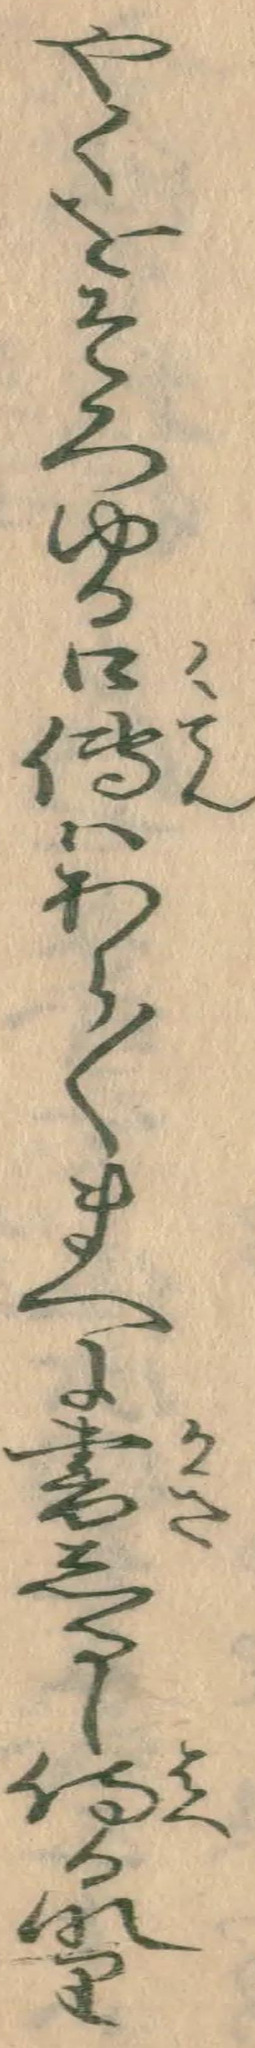やくをそろゆる口伝はあら〳〵まへに書しるし侍るなり
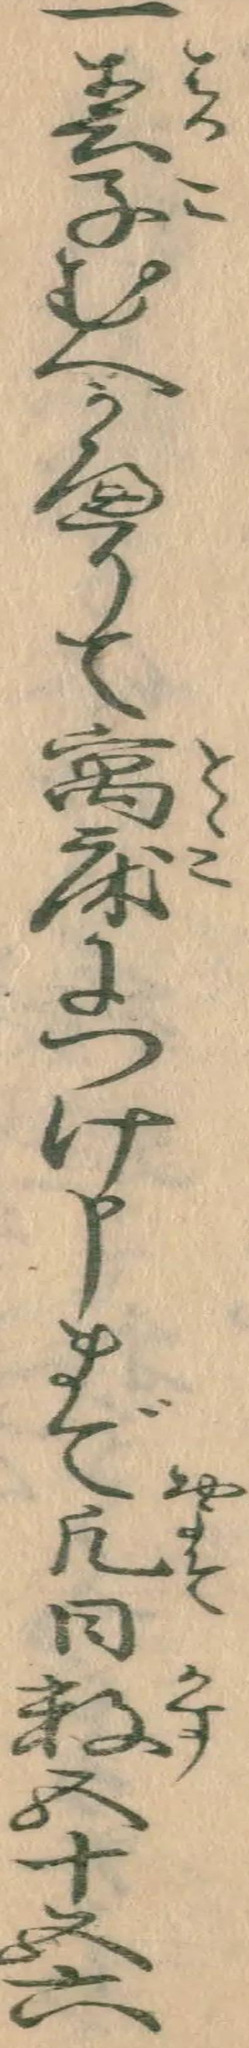一春子むへかへりて寓床につけ申まで凡日数五十五六
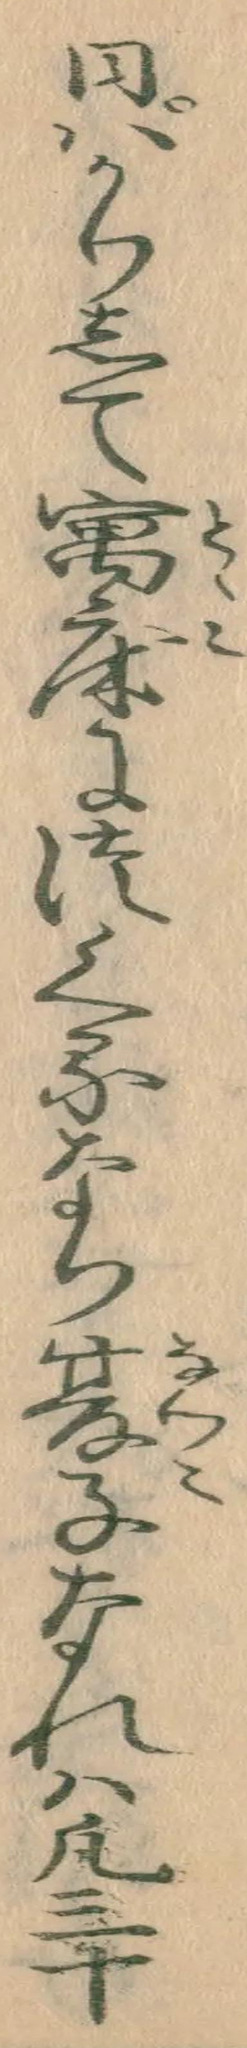日。はかりして寓床につくるなり夏子なれは凡三十
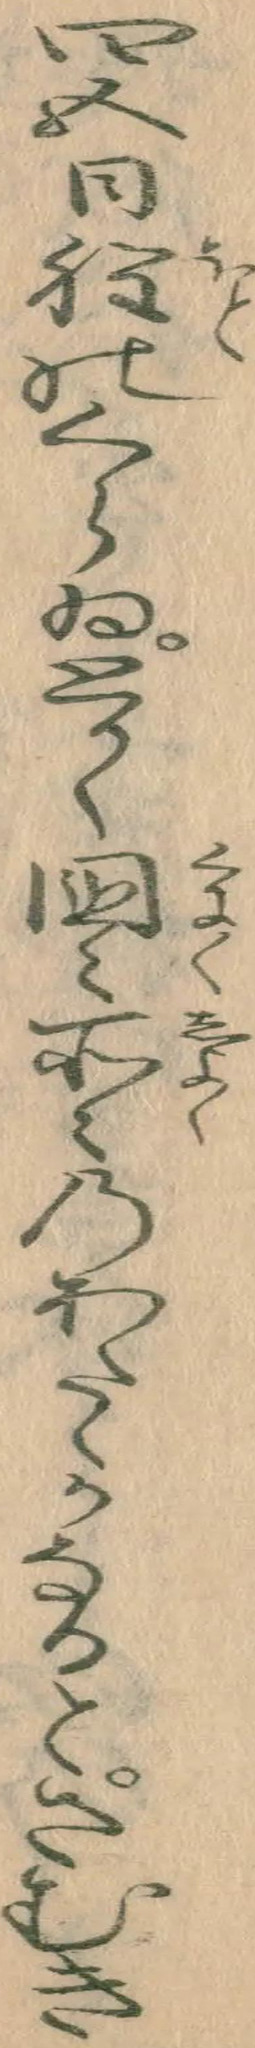四五日程のくらゐ。とかく国々所々のあたゝかなると。さむき
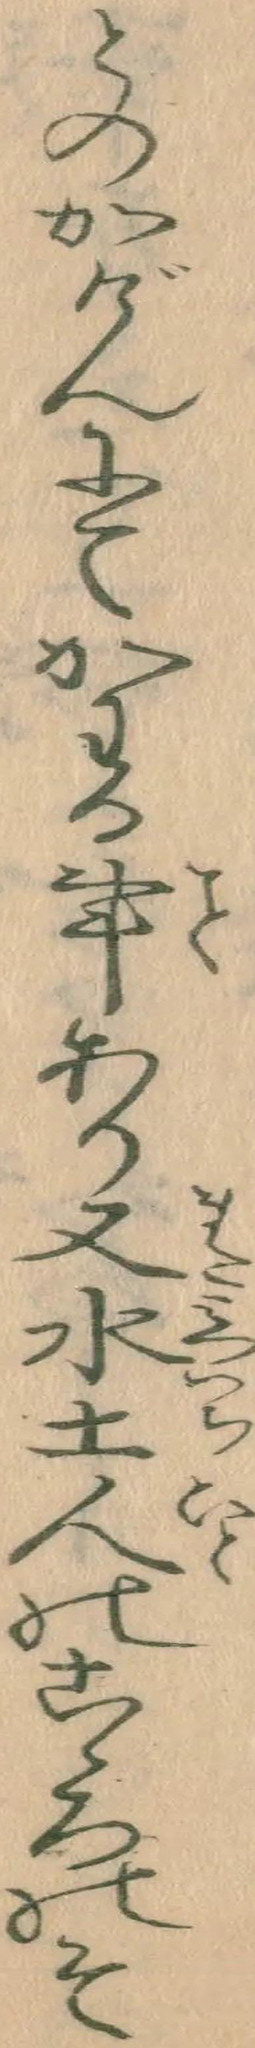とのかげんにてかわる事あり又水土人のこゝろのそ
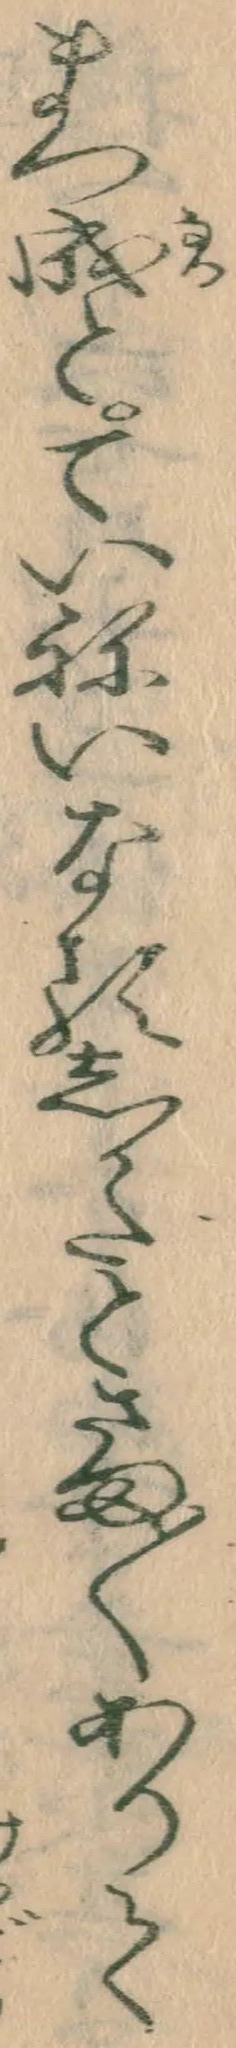まつ成と。ていねいなるしかたとさま〳〵ありて
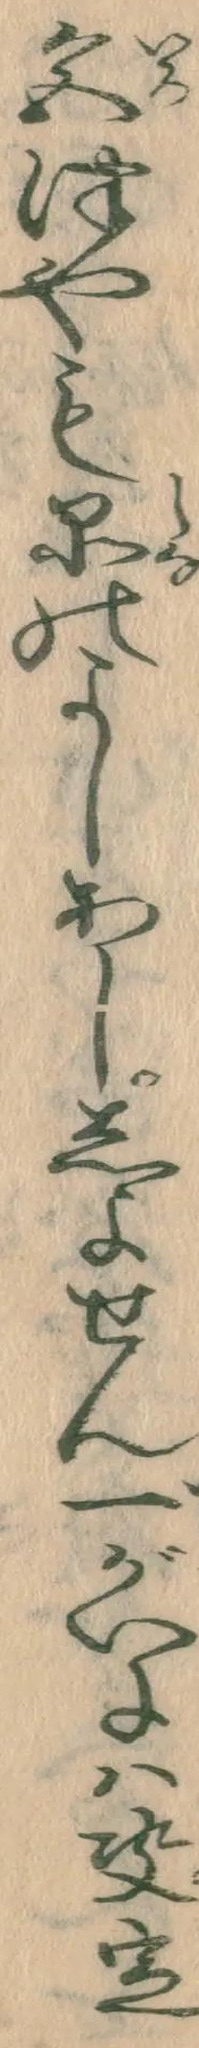色つやも品のよしあし。しよせん一がいには決定
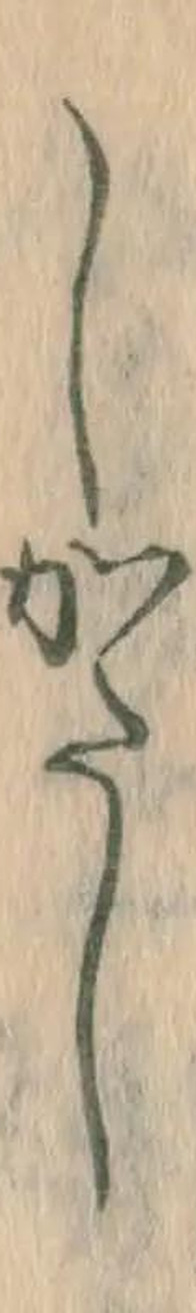しかたし
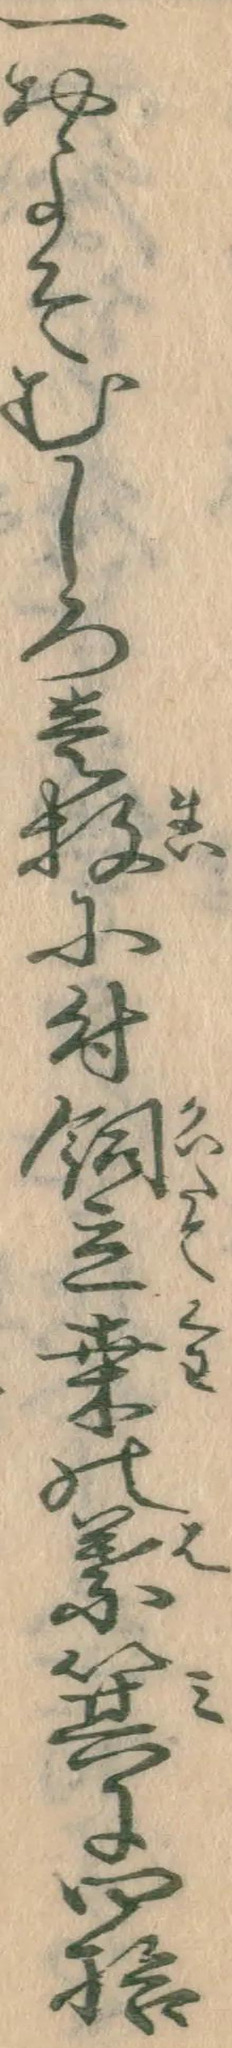一およそむしろ壱枚に付飼立桑の葉箕に四拾
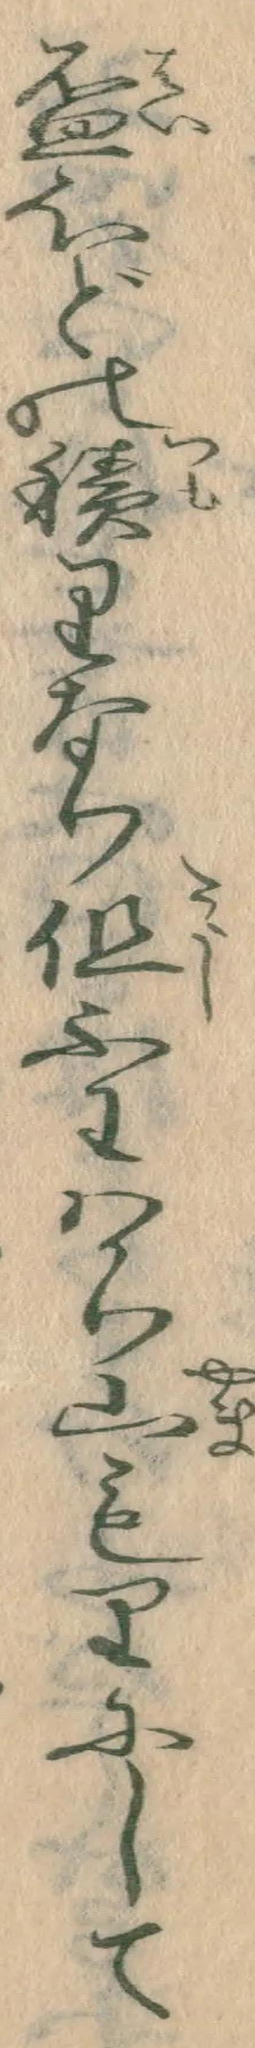盃ほどの積りなり但ふわはかり山もりにして
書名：蚕飼養法記
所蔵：国立国会図書館 National Diet Library, JAPAN
